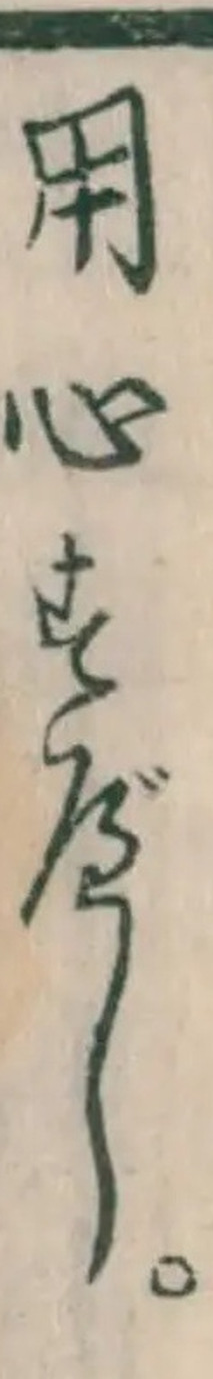用心すべし。

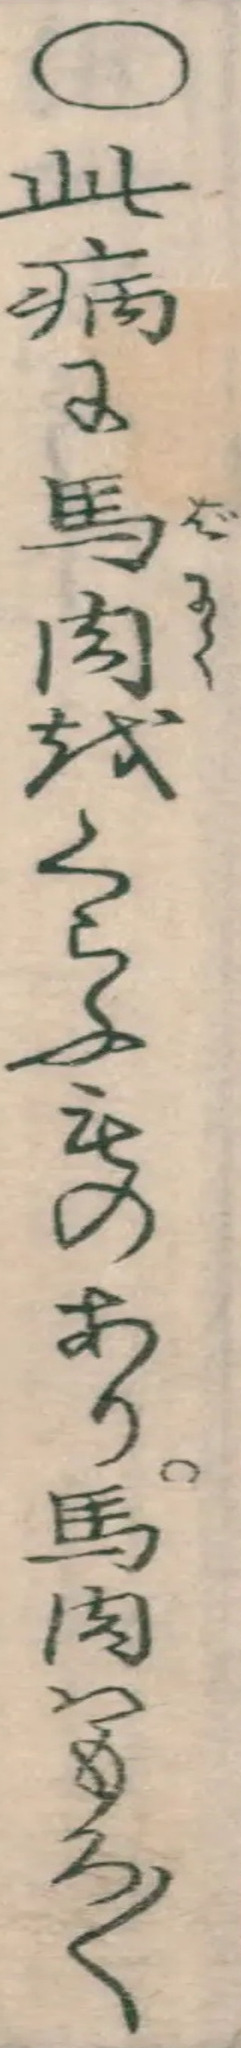○此病に馬肉をくらふものあり。馬肉はもろ〳〵
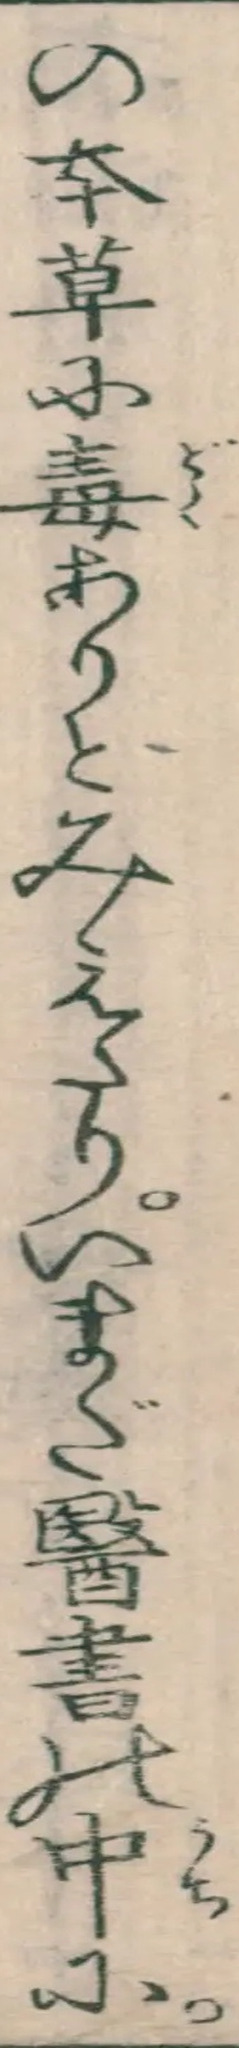の夲草に毒ありとみえたり。いまだ醫書の中に。
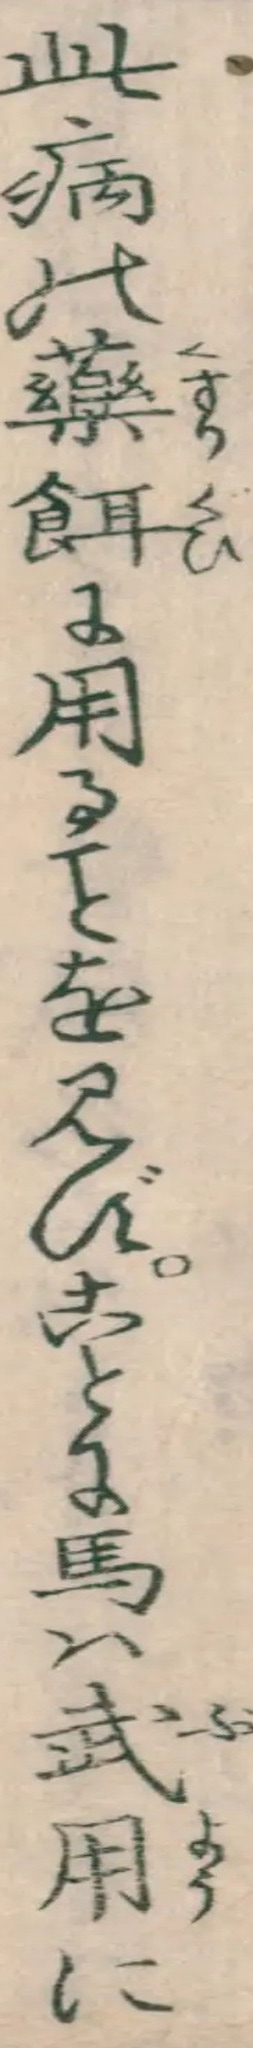此病の薬餌に用ることを見ず。ことに馬は武用に
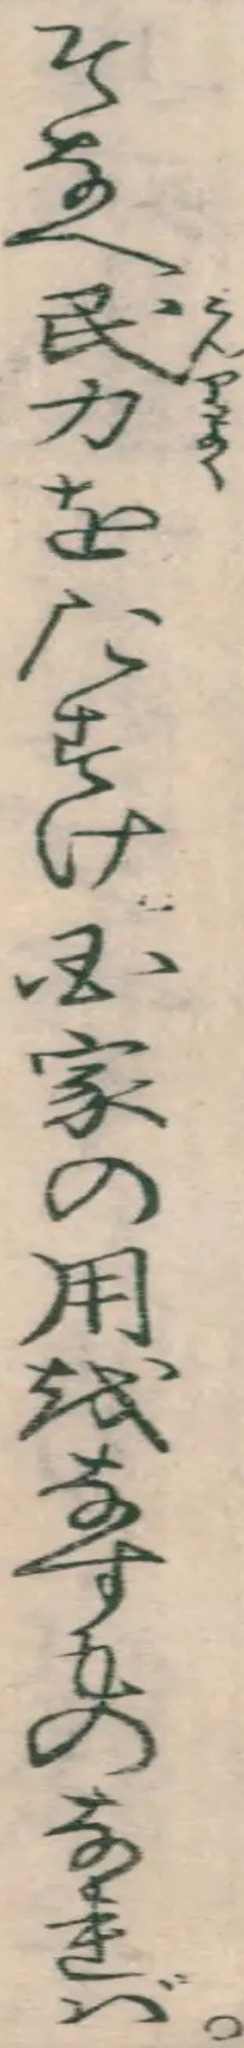そなへ民力をたすけ国家の用をなすものなれば。
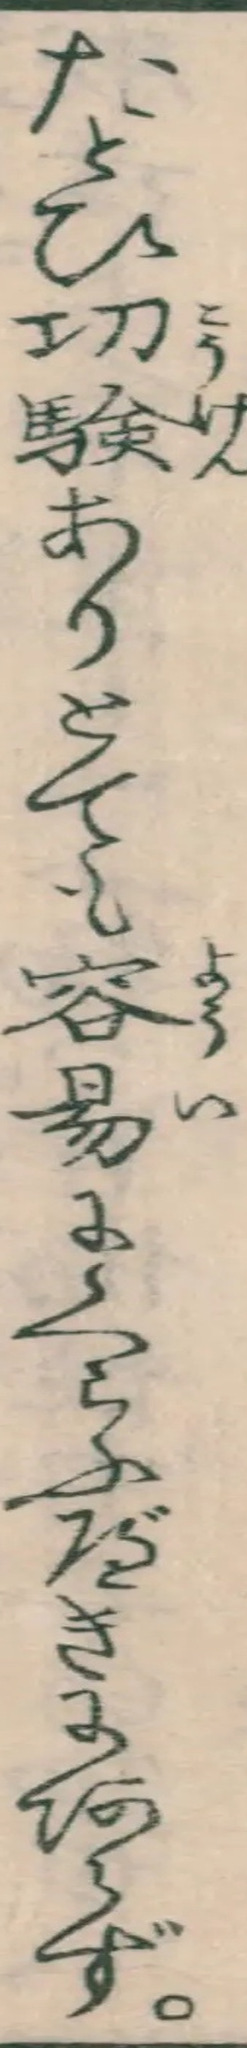たとひ功験ありとても容易にくらふべきにあらず。
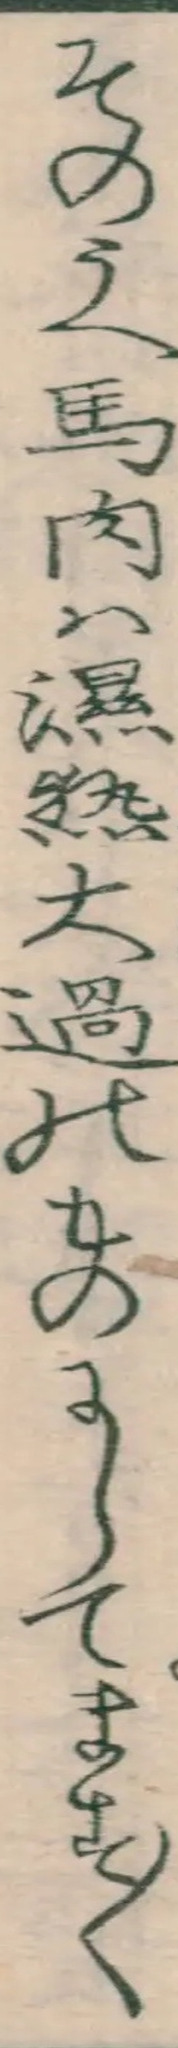そのうへ馬肉は湿熱大過のものにして。ます〳〵
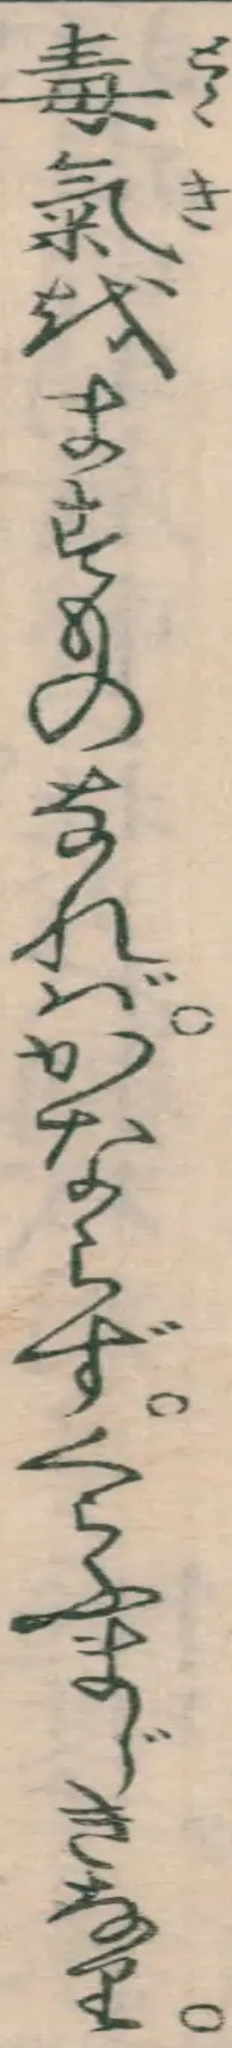毒氣をますものなれば。かならず。くらふまじきなり。
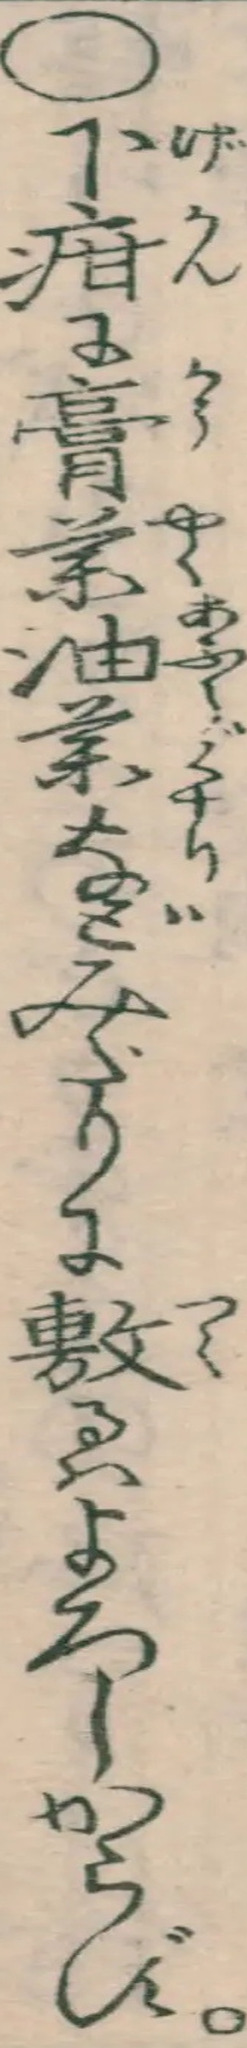○下疳に膏薬油薬などみたりに敷るはよろしからず。
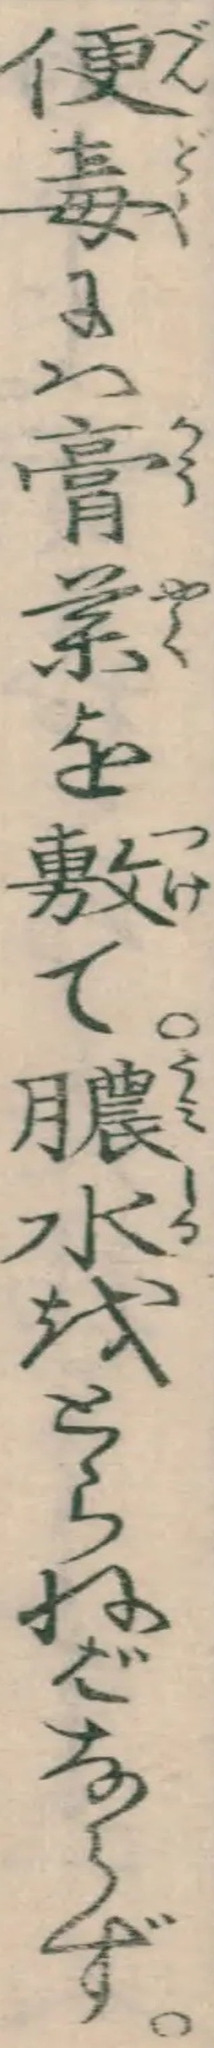便毒には膏薬を敷て。膿水をとらねばならず。
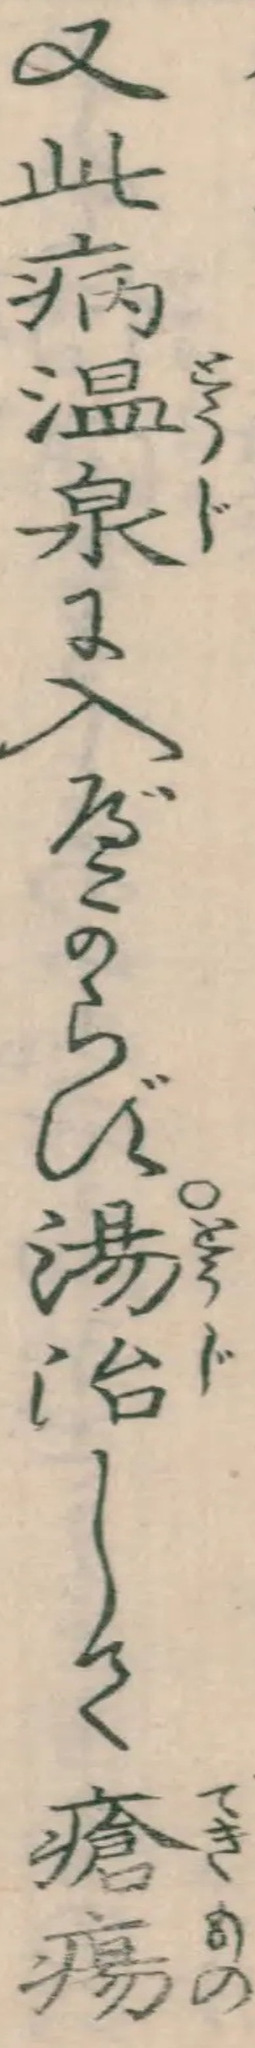又此病温泉に入べからず。湯治して瘡傷
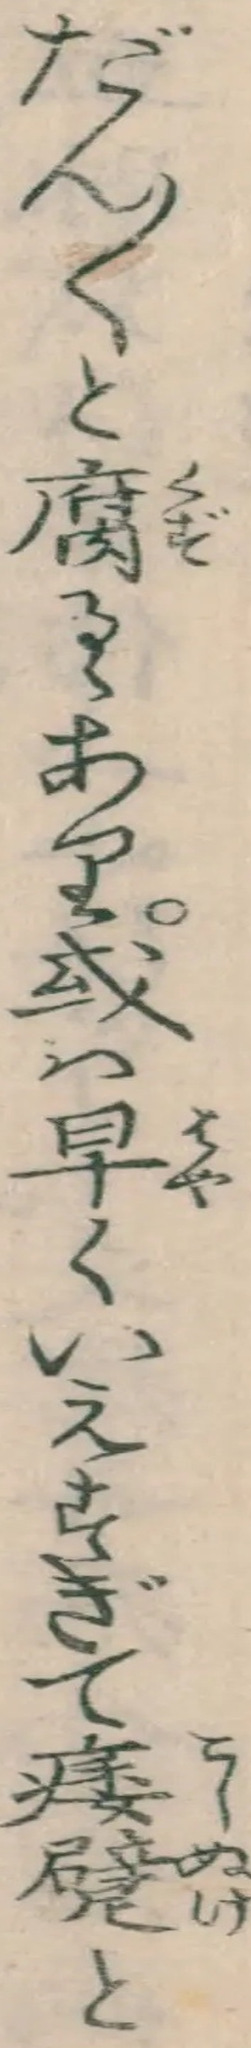だん〳〵と腐るゝあり。或は早くいえすぎて痿と
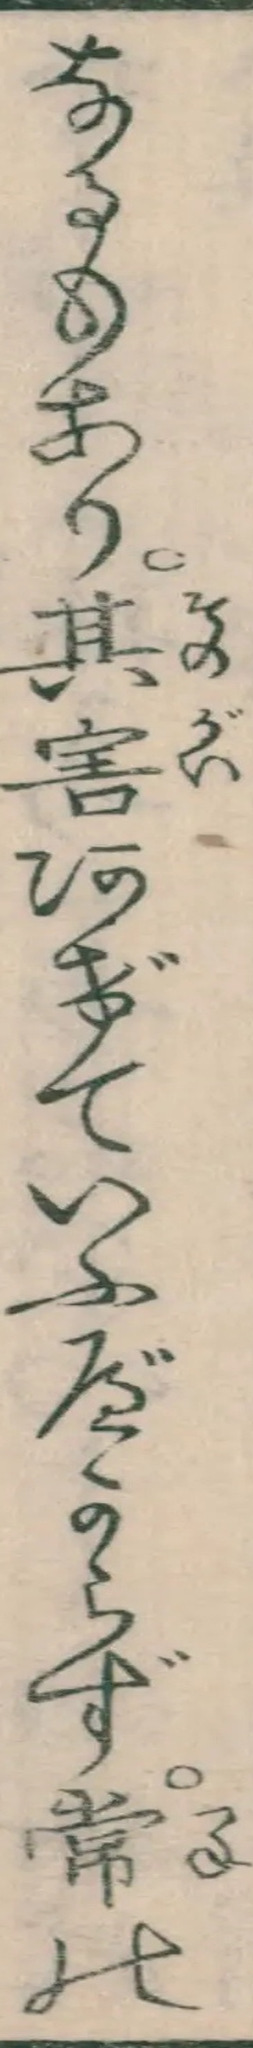なるものあり。其害あげていふべかるず。常の
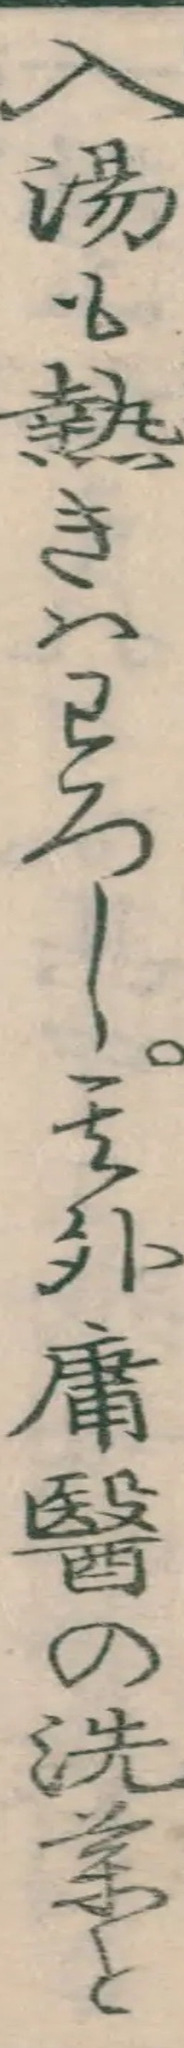入湯も熱きはわろし。其外庸醫の洗薬と
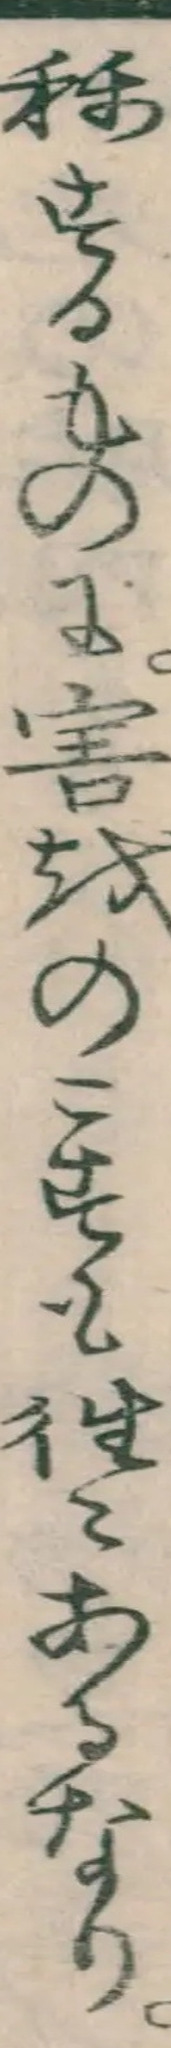称するものに。害をのこすも往々あるなり。
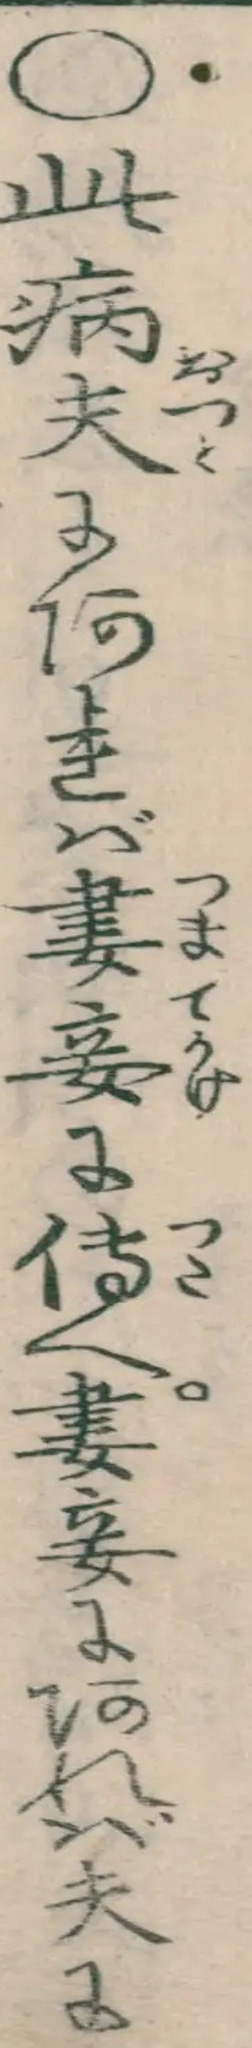○此病夫にあれば妻妾に傳へ。妻妾にあれば夫に
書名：瘡家示訓
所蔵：国立国会図書館 National Diet Library, JAPAN
